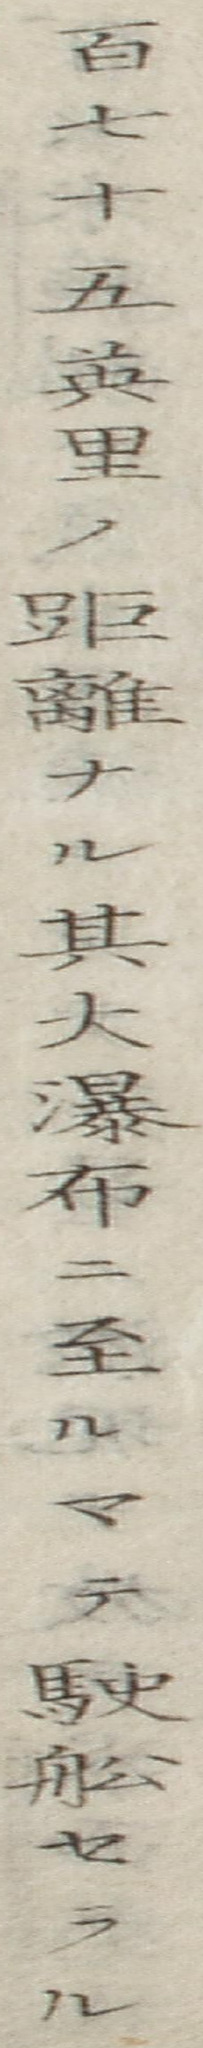百七十五英里ノ距離ナル其大瀑布ニ至ルマテ駛舩セラル

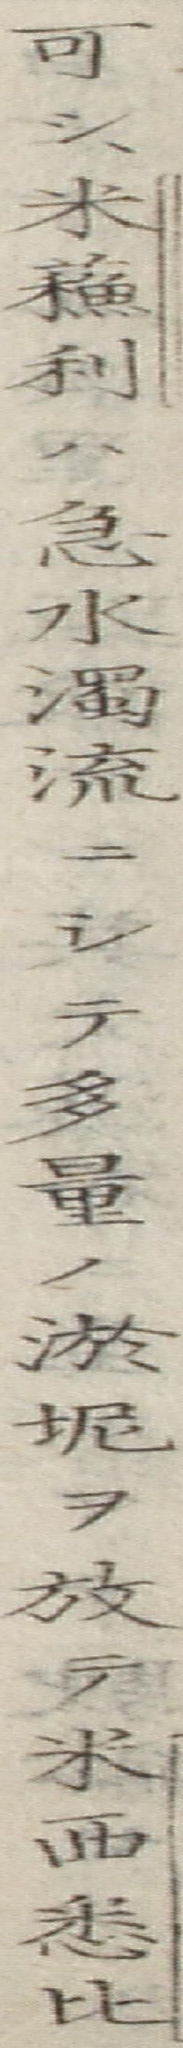可シ、米蘇利ハ急水濁流ニシテ多量ノ淤泥ヲ放テ米西悉比
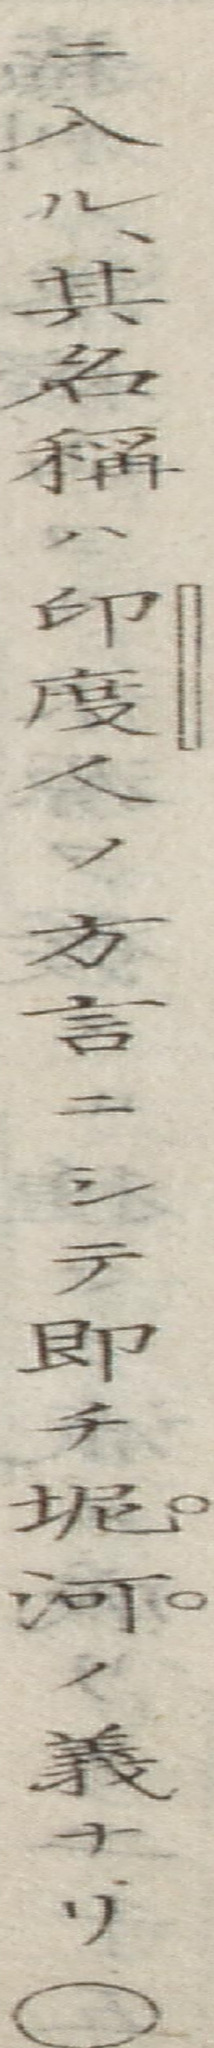ニ入ル、其名称ハ印度人ノ方言ニシテ即チ泥河ノ義ナリ○
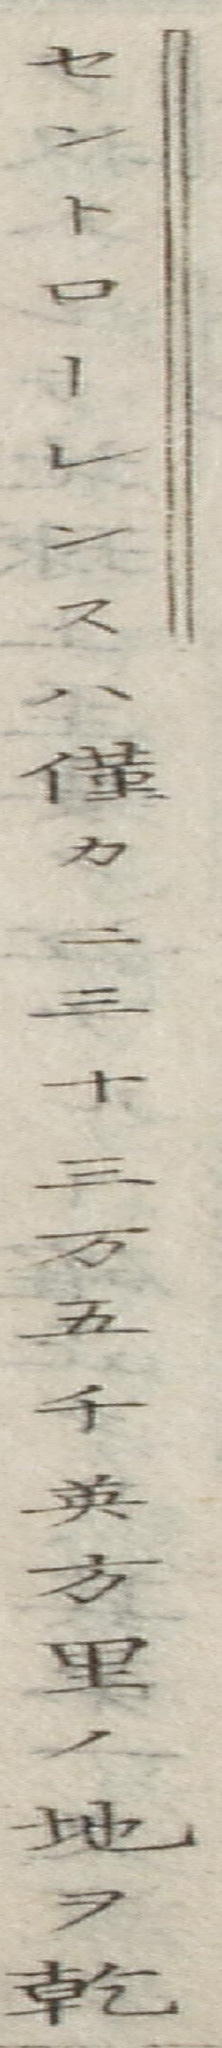セントローレンスハ僅カニ三十三万五千英里ノ地ヲ乾
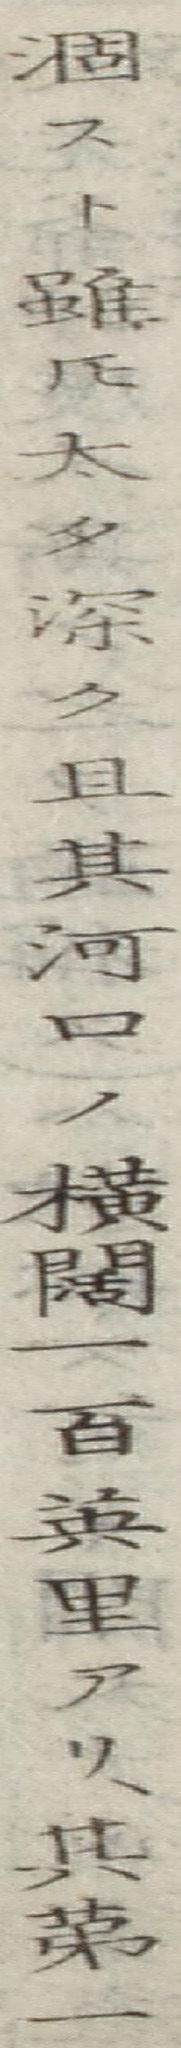涸スト雖トモ太タ深ク且其河口ノ横闊一百英里アリ、其第一
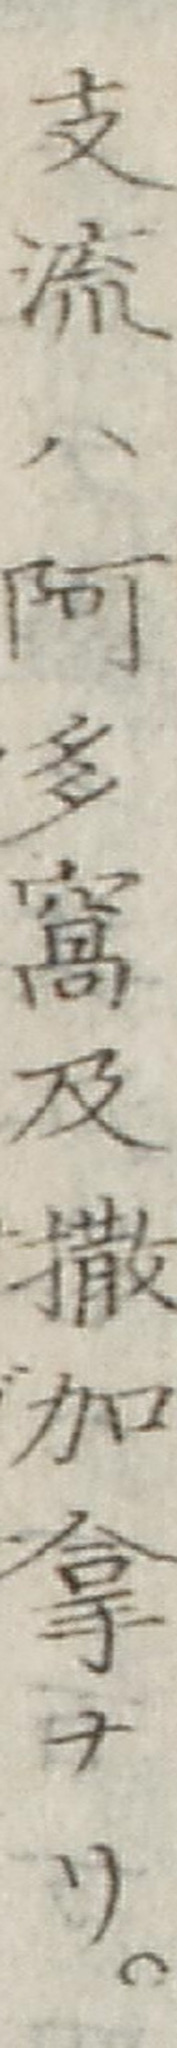支流ハ阿多窩及撒加拿ナリ。
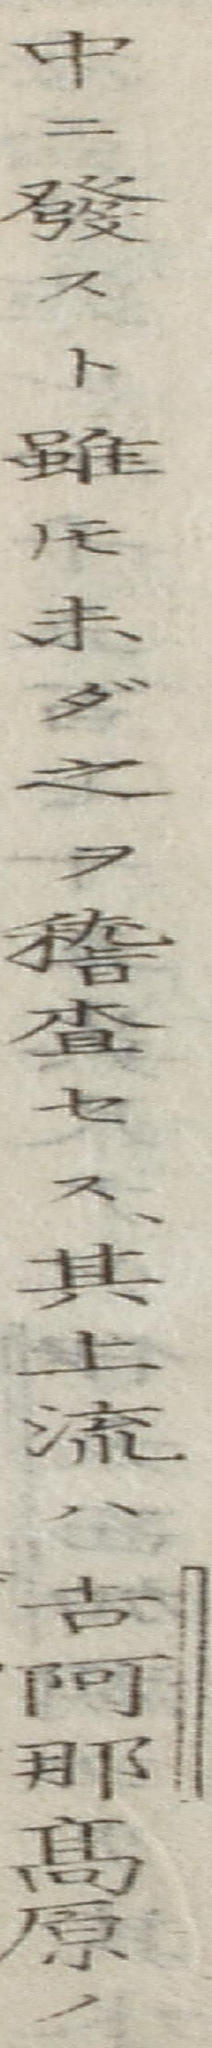中ニ発スト雖トモ未ダ之ヲ稽査セス、其上流ハ吉阿那高原ノ
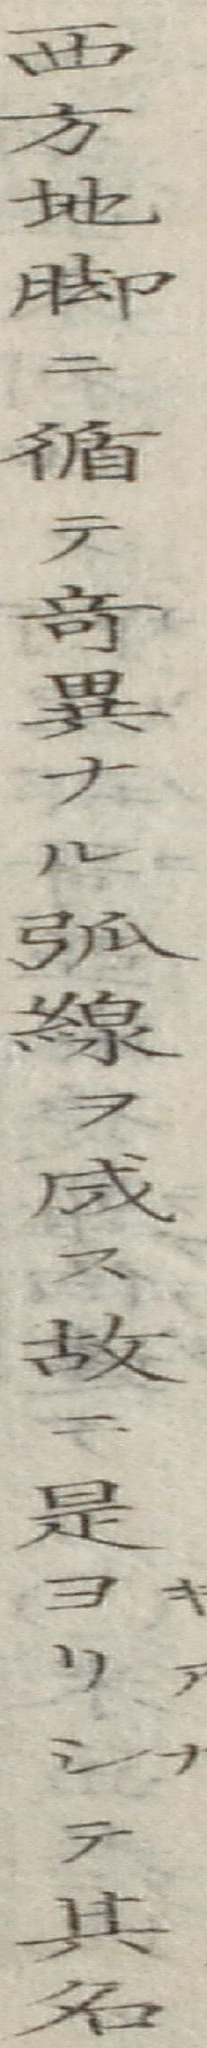西方地脚ニ循テ奇異ナル弧線ヲ成ス故ニ是ヨリシテ其名
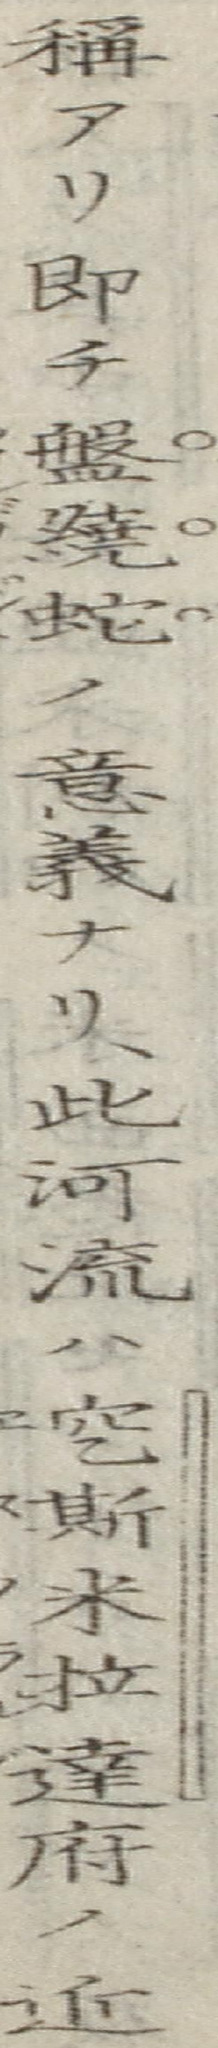称アリ即チ盤繞蛇ノ意義ナリ、此河流ハ穵斯米拉達府ノ近
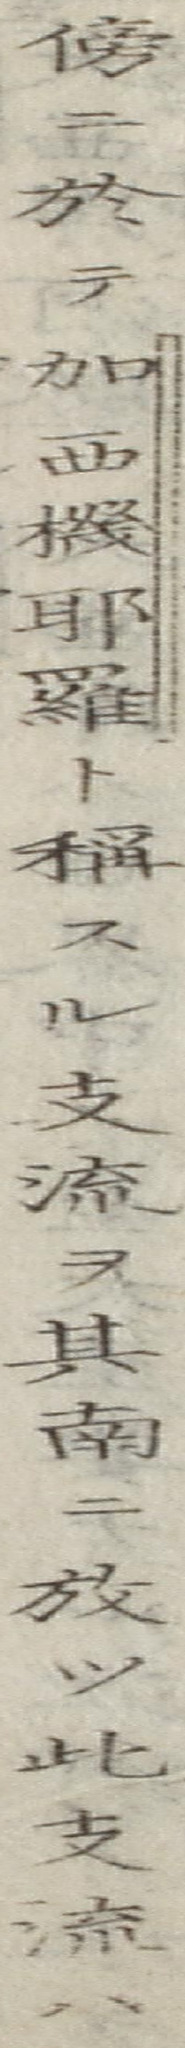傍ニ於テ加西機那羅ト称スル支流ヲ其南ニ放ツ此支流ハ
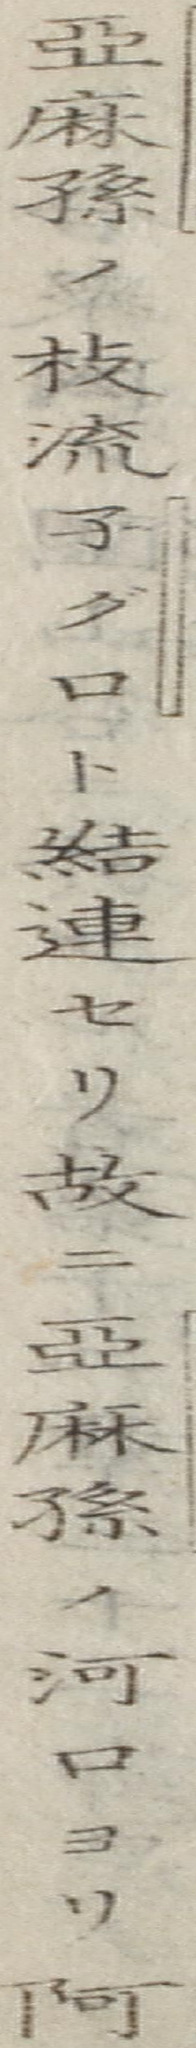亜麻孫ノ枝流ネグロト結連セリ故ニ亜麻孫ノ河口ヨリ阿
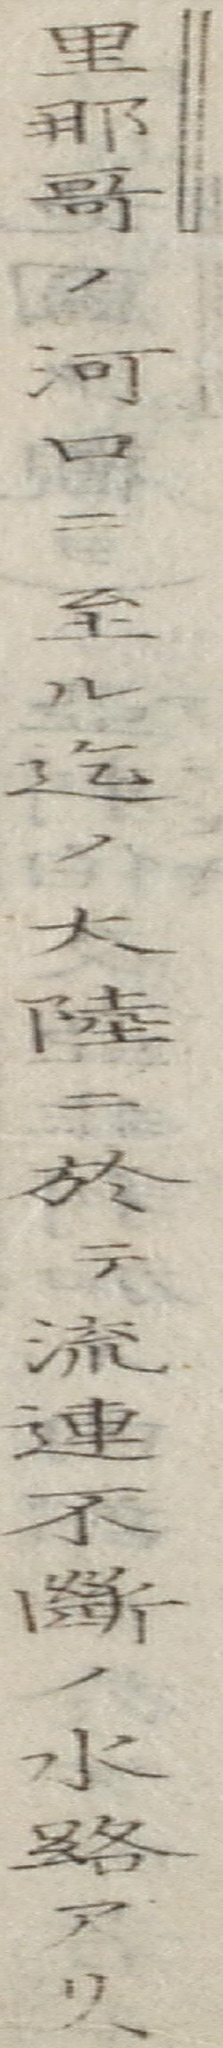里那哥ノ河口ニ至ル迄ノ大陸ニ於テ流連不断ノ水路アリ、
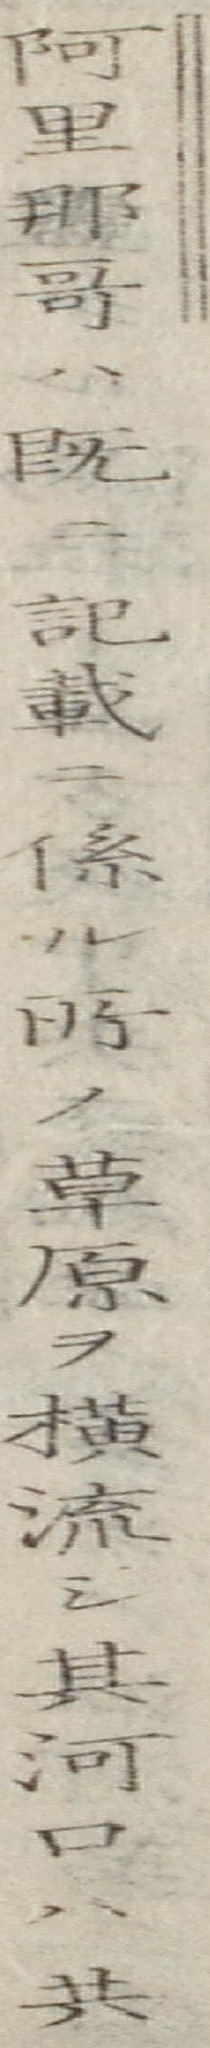阿里那哥ハ既ニ記載ニ係ル所ノ草原ヲ横流シ其河口ハ共
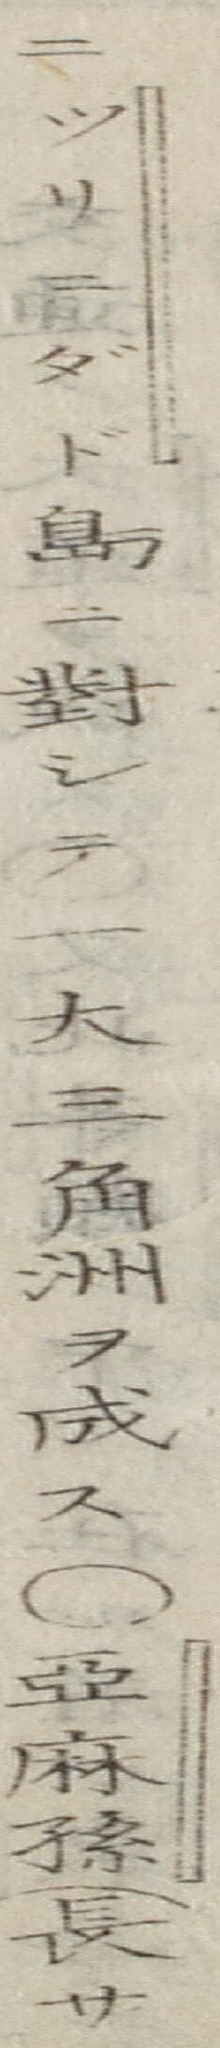ニツリニダド島ニ対シテ一大三角洲ヲ成ス○亜麻孫（長サ
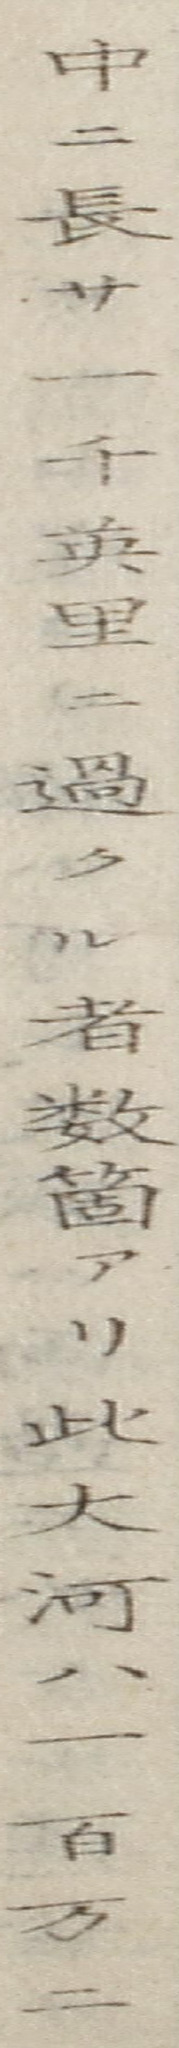中ニ長サ一千英里ニ過クル者数箇アリ此大河ハ一百万ニ
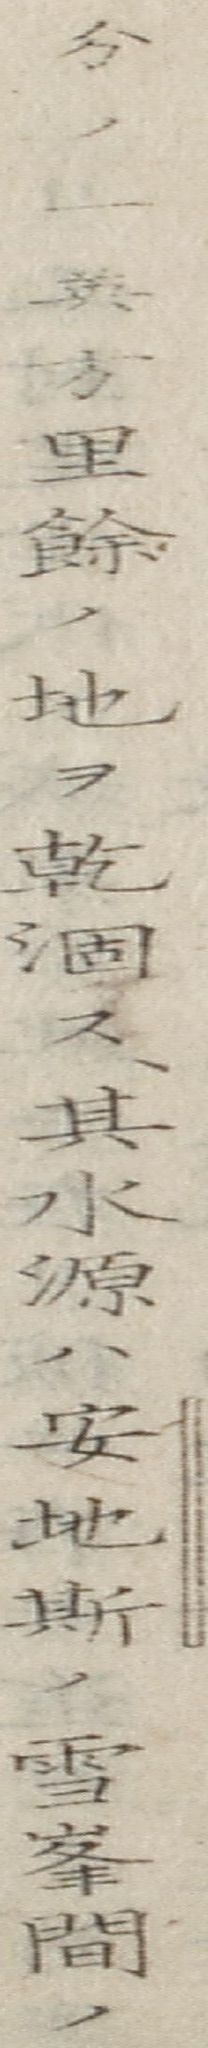分ノ一英方里余ノ地ヲ乾涸ス、其水源ハ安地斯ノ雪峯間ノ
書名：地形論　巻二
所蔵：東京大学地震研究所図書室 Earthquake Research Institute Library, The University of Tokyo, JAPAN
